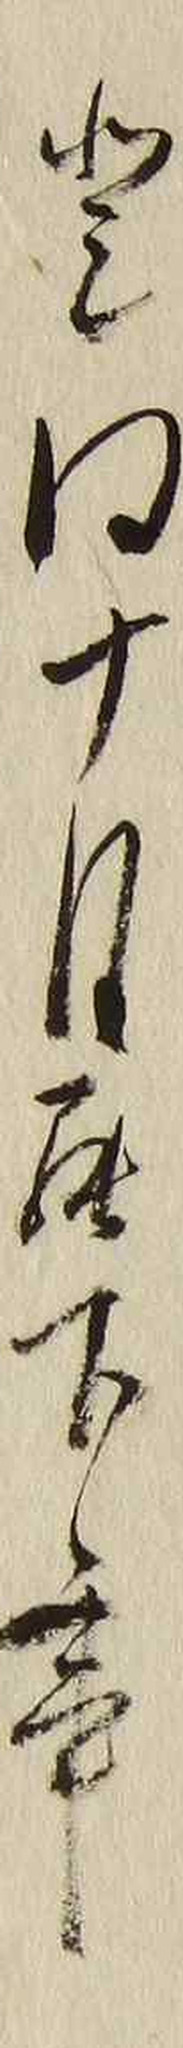登同十月罷下候事
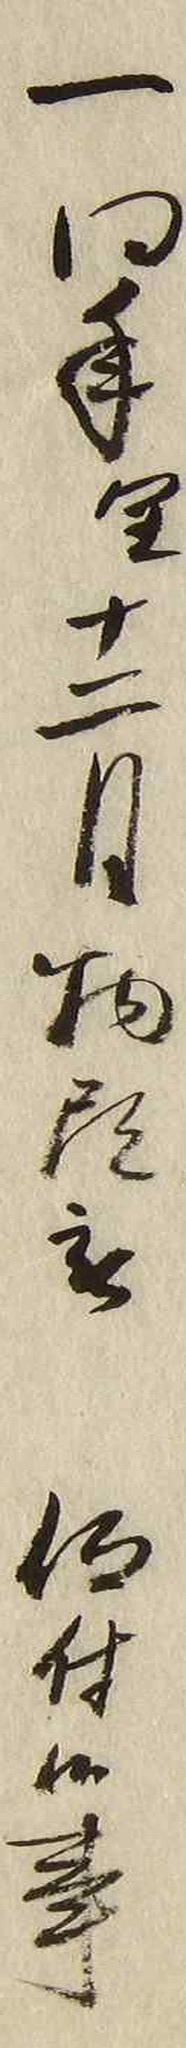一同年閏十二月物頭被仰付候事
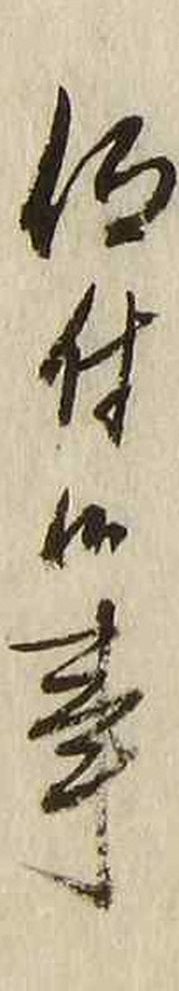仰出候事

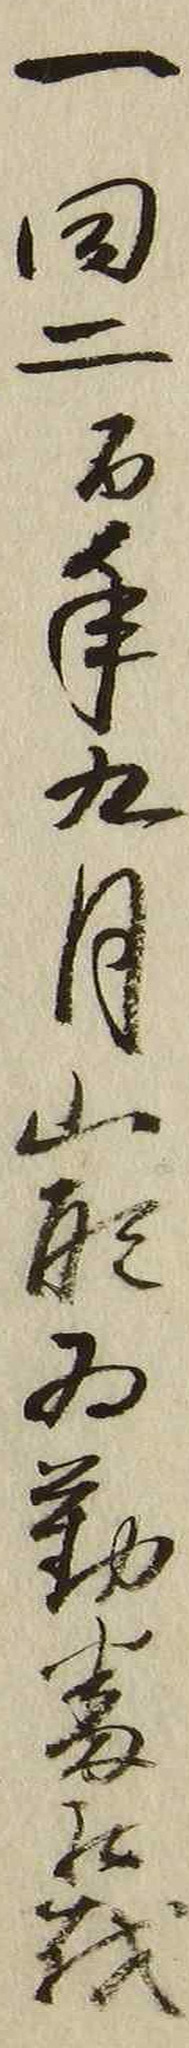一同二酉年九月山形為勤番罷越
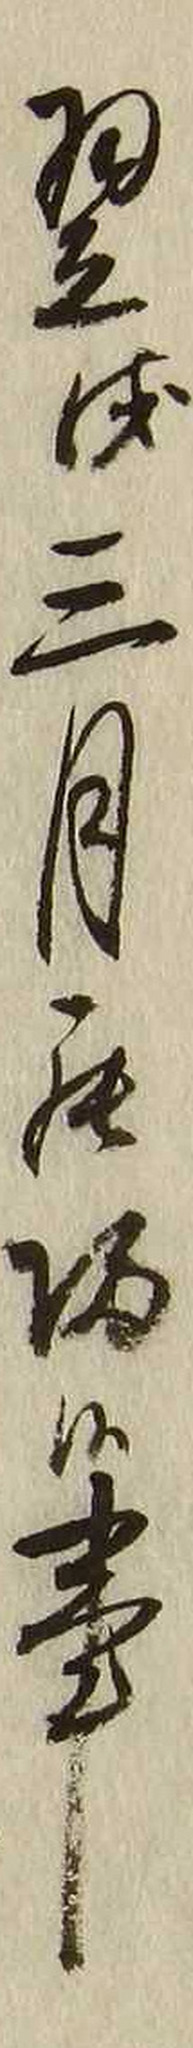翌戌三月罷帰候事
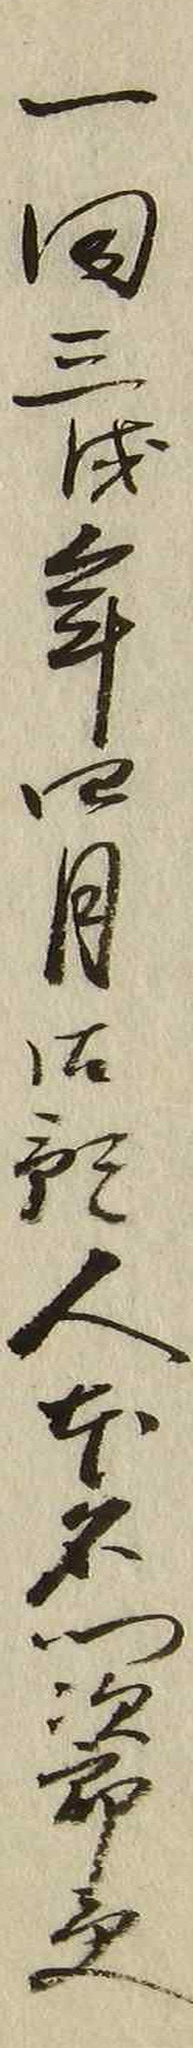一同三戌年四月御預人本多門次郎受
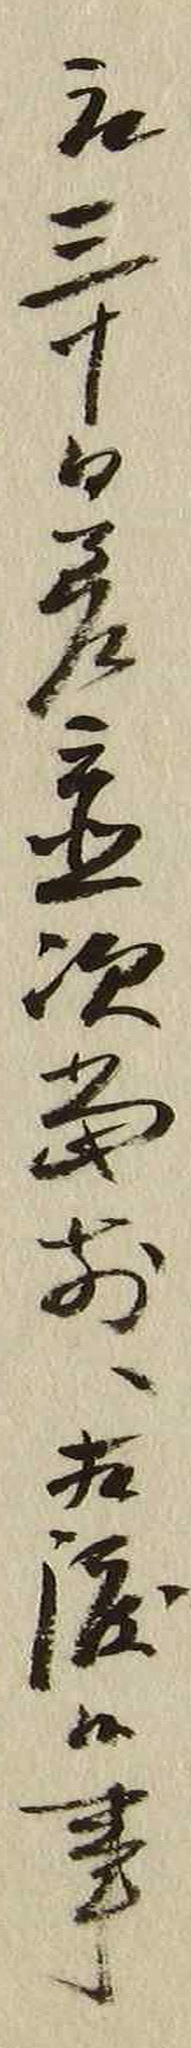取三十日差置次当前へ相渡候事
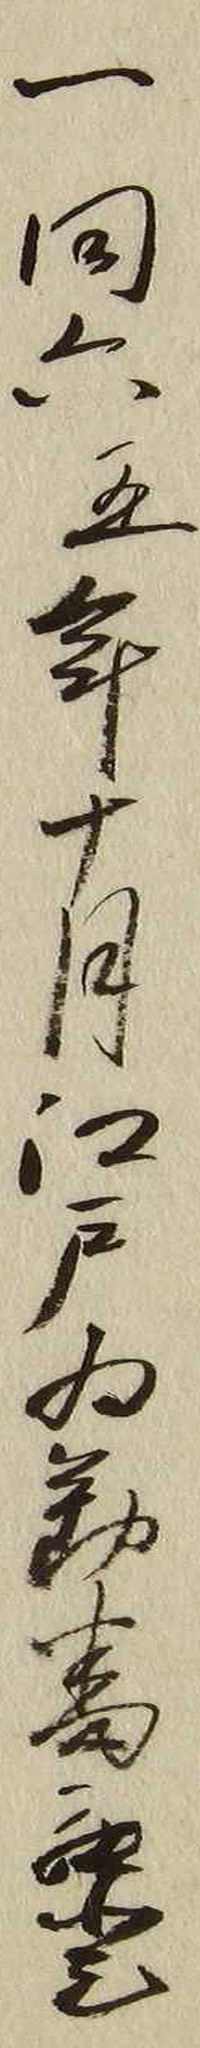一同六丑年十月江戸為勤番罷登
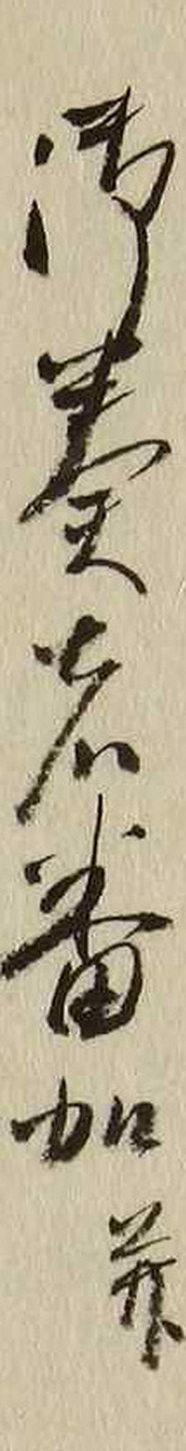御奏者番加并
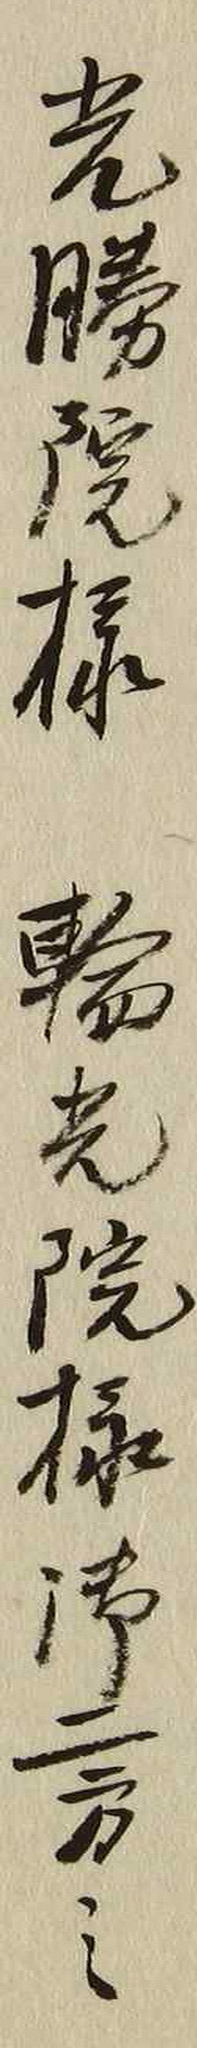光勝院様輪光院様御二方之
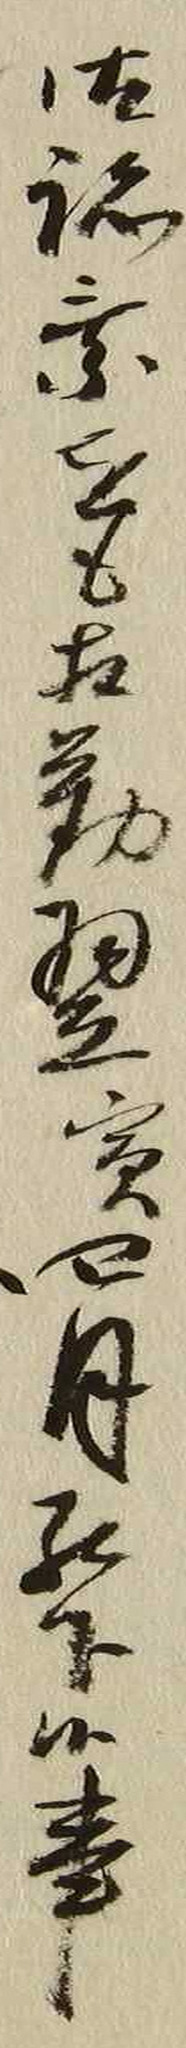御跡乗をも相勤翌寅四月罷下候事
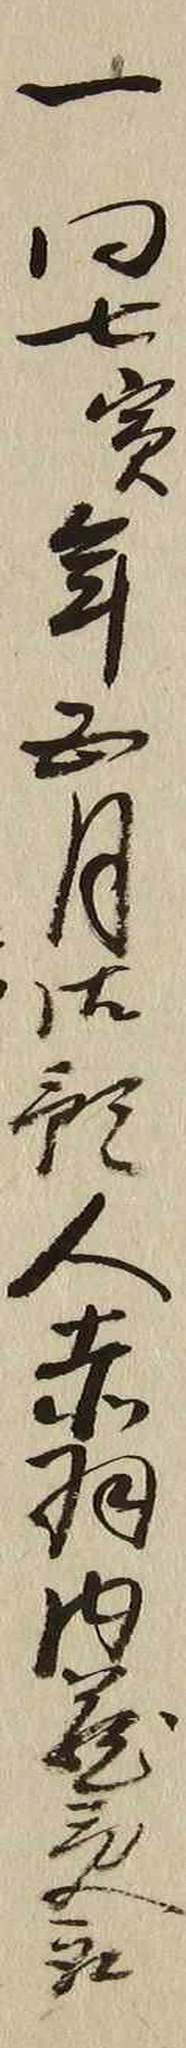一同七寅年五月御預人赤羽内蔵受取
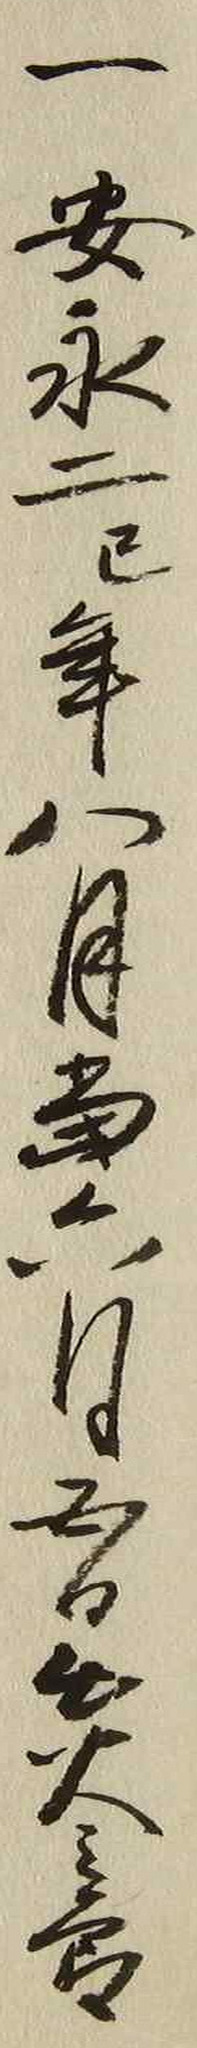一安永二巳年八月当六月五日出火之節
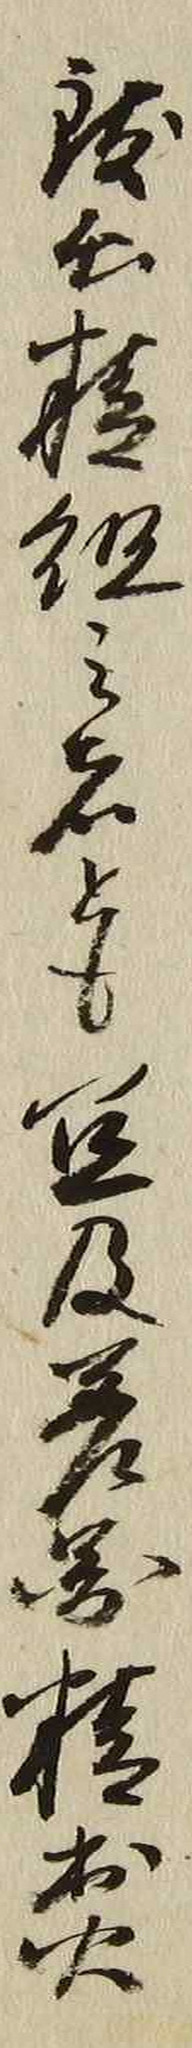致出精組之者とも宜及差図精出火
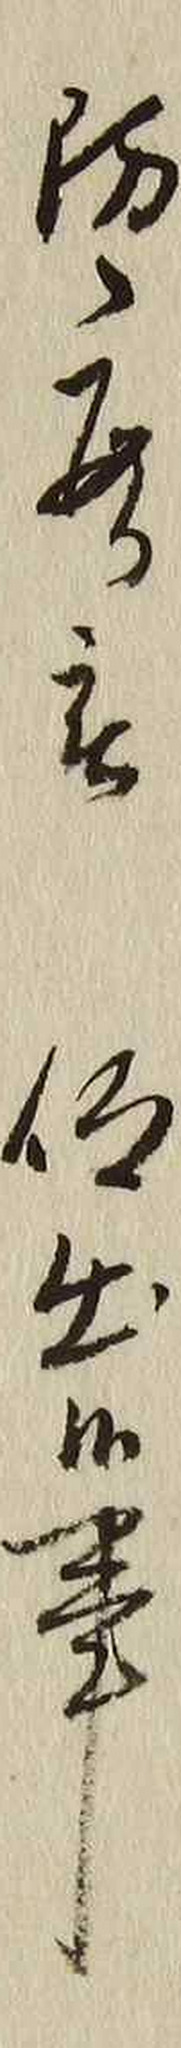防候段被仰出候事
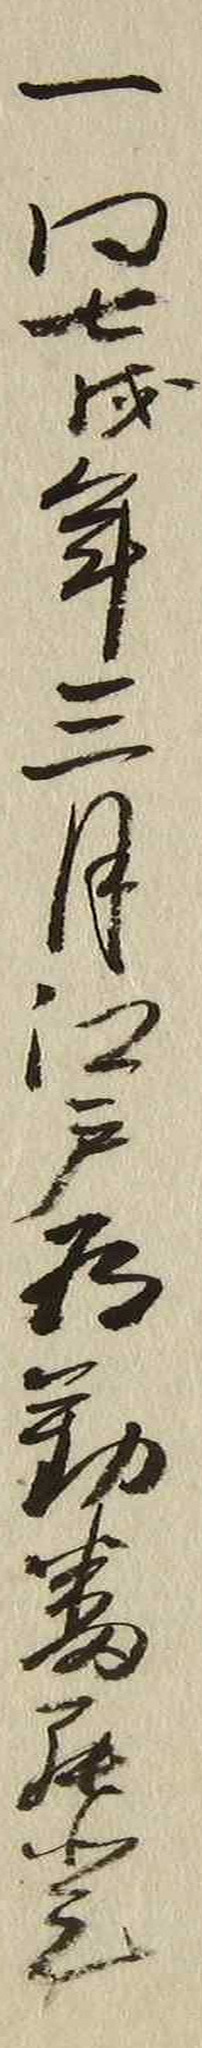一同七戌年三月江戸為勤番罷登
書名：諸士系譜　巻之356　す之部6
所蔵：会津若松市立会津図書館
